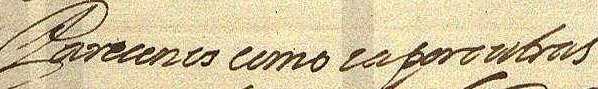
Parecenos como ia por outras
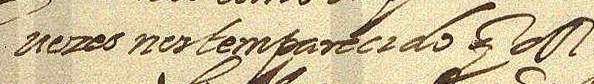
uezes nos tem parecido q̄ o R
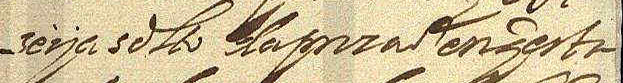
seija solto da prizaõ en q̄ esta
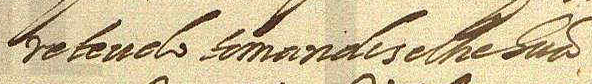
reteudo tomandoselhe huā
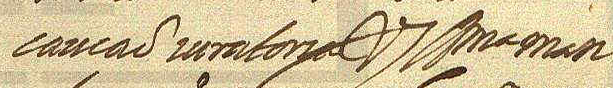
cauçaõ iuratoria V Jllma man
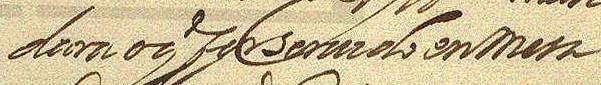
dara o q̄ for seruido en mesa
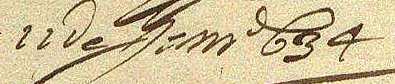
11 de Janro 634
